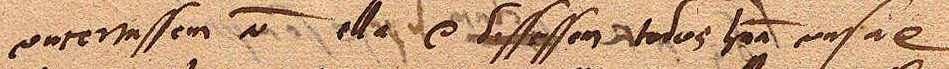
concertassem c̄o ella e dissessem todos hūa cousa e
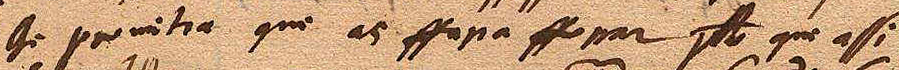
lhe promeria que as ffaria fforrar p̄llo que assi
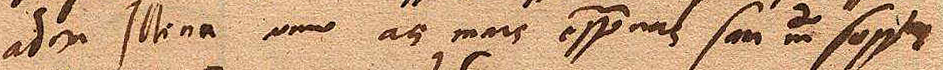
a dita Jllena como as mais ēspuas sam mto sosptas
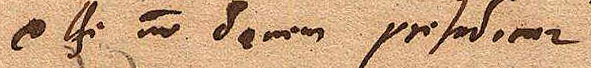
e lhe n̄o deuem preJudicar
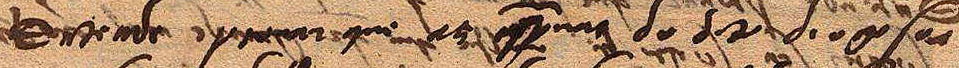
Entende prouar que as ēspuas do dito diogo soa
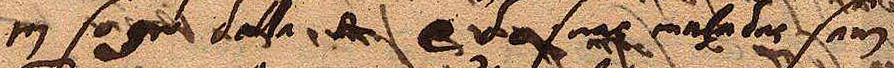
rez sogro della R e de suas cunhadas sam
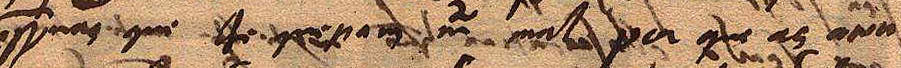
ēspuas que lhe queriam mto mal por que as acou
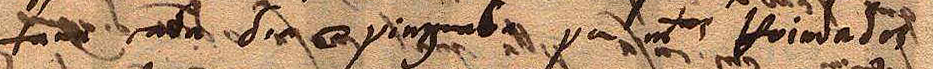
taua cada dia e pinguava por mtas Roindades
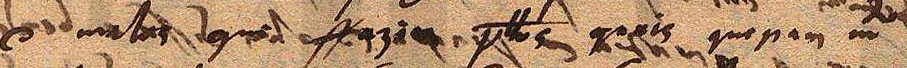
e malas que ffazia p̄llos quais queriam mto
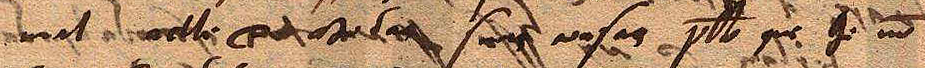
mal a elle e a todas suas cousas p̄llo que lhe nō
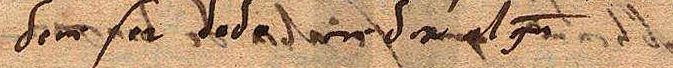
deue ser dado credito algū
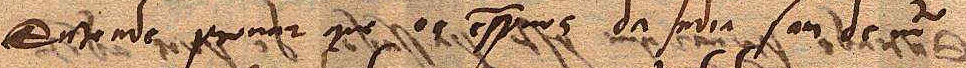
Entende prouar que os ēspuos da Jndia sam de mto
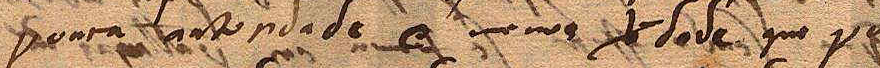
pouca autoridade e menos ꝟdade que por
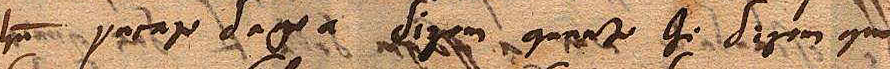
hū pucaro dagoa dizem quanto lhe dizem que
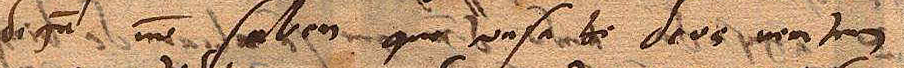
digā nō sabem que cousa he deos nem tem
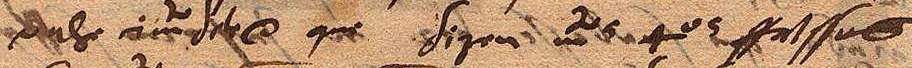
conhecimto dele e que dizem mtos tos ffalssos
